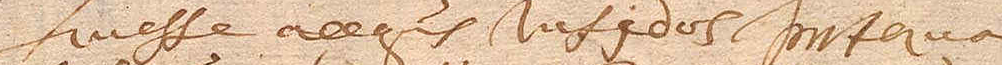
tiuesse allgūs lusidos Jmterua
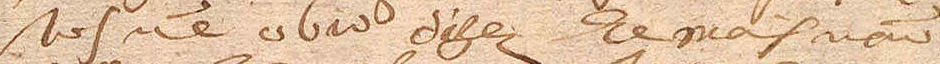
los nē ovio dizer he mais não
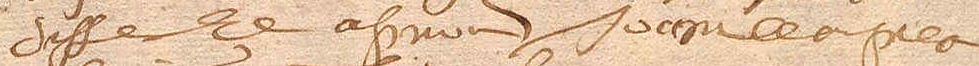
disse he assinou Joam llanprea
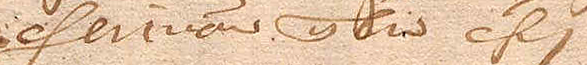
escriuão q̄ ho esrj
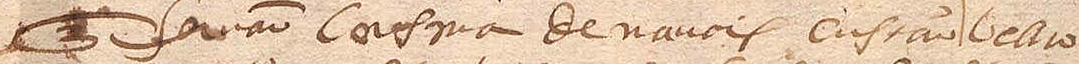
item fernão Coresma de nauais cristão velho
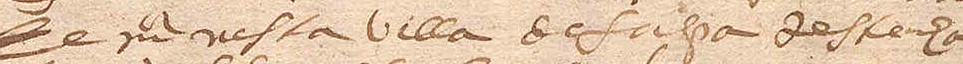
he mor nesta villa de serpa testenha
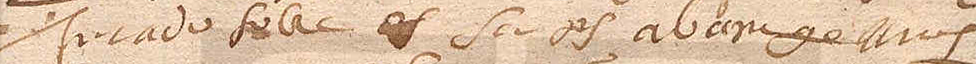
Jurado sobre os santos avamgelhos
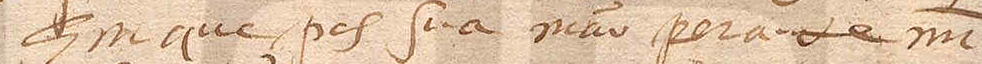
Em que pos sua mão perante mī
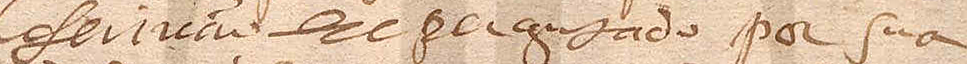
escriuão he pergutado por sua
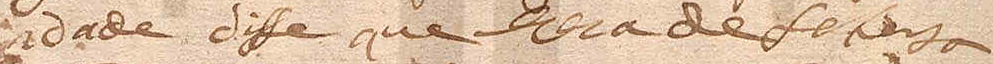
idade disse que hera de setenta
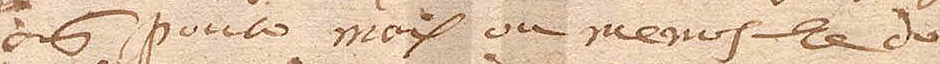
ans pouco mais ou menos he do
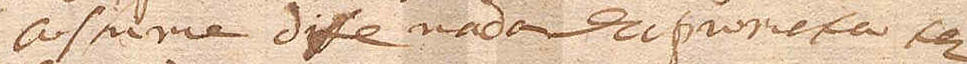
costume disse nada he prometeo ter
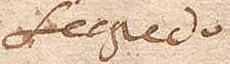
segredo
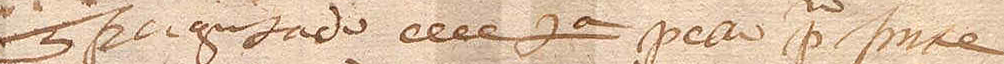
item pergutado elle ta pello pro Jmte
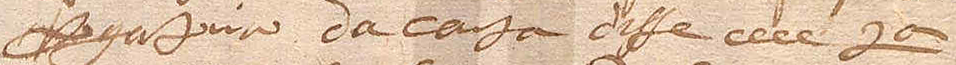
Rogatoiro da carta disse elle ta
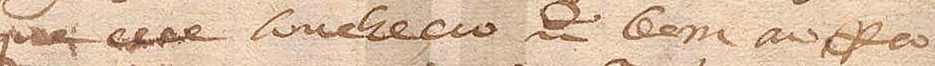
que elle conheçeo mto bem ao Reo
